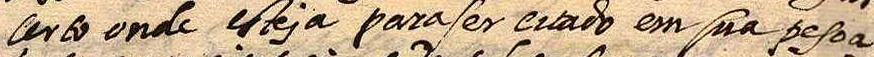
certo onde esteja para ser citado em sua pesoa
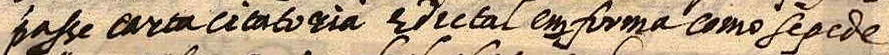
passe carta citatoria Edictal em forma como se pede
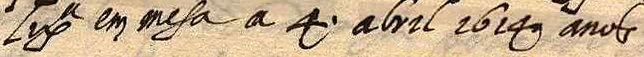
Lixa em mesa a 4. abril 1614 anos
